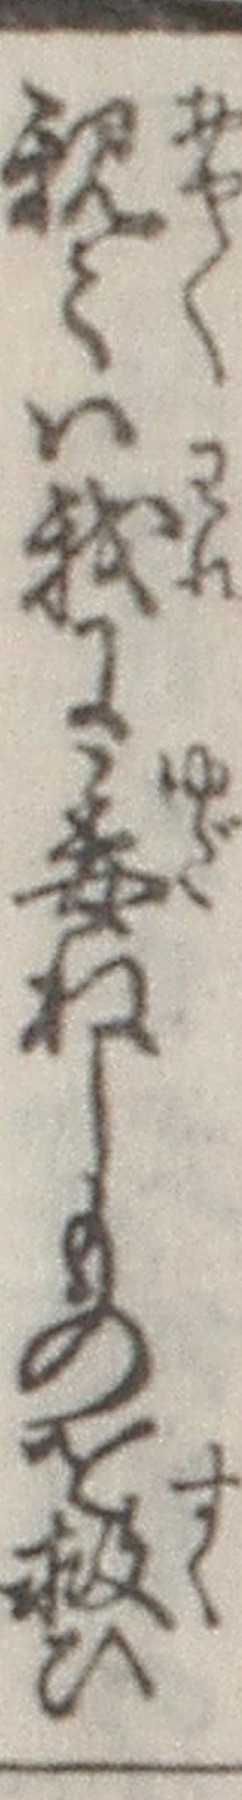親〻は我に委ねしものを救ひ
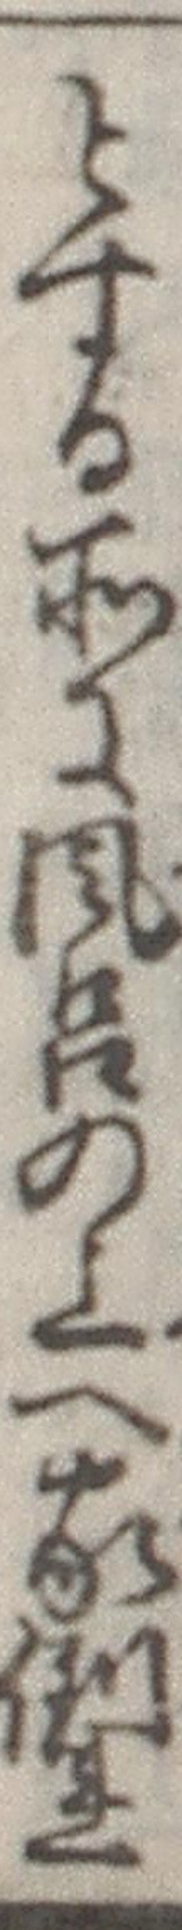とする所に風呂の上へ家倒れ
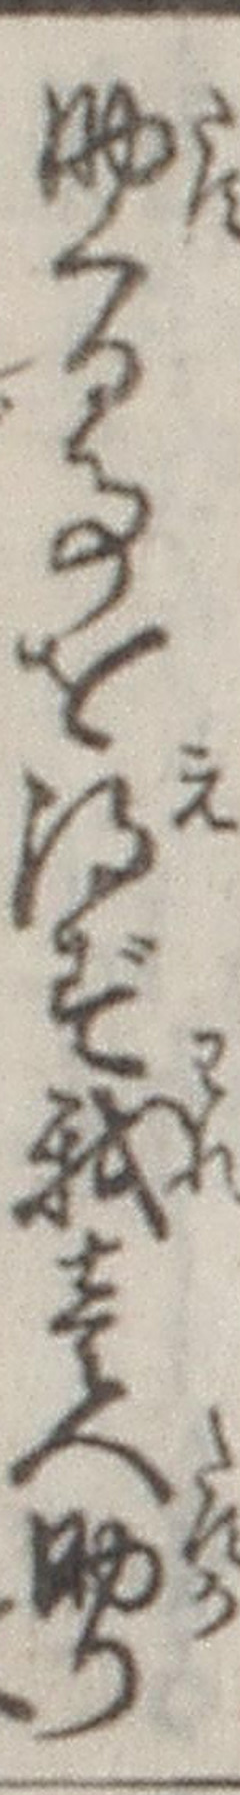助くる事を得ず我壱人助りて
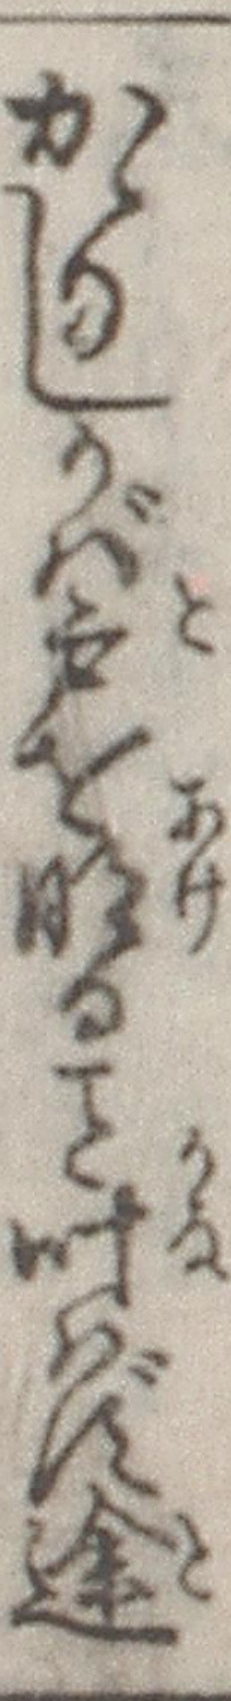かゝりしかば戸を明ること叶はず途
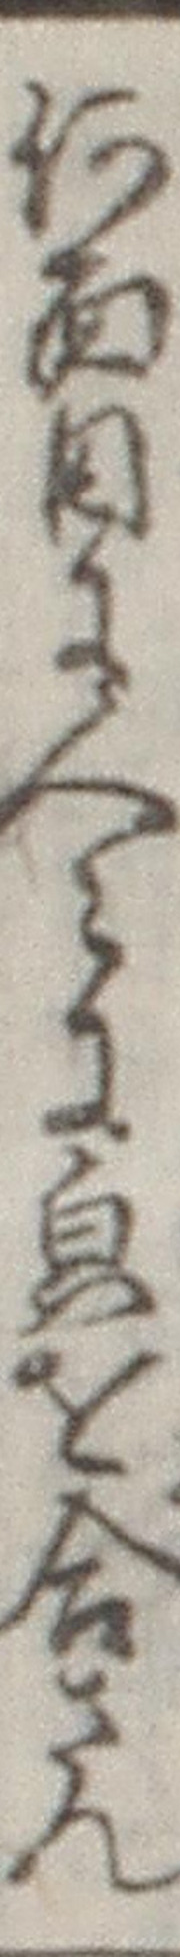何面目に人々に貌を合さん
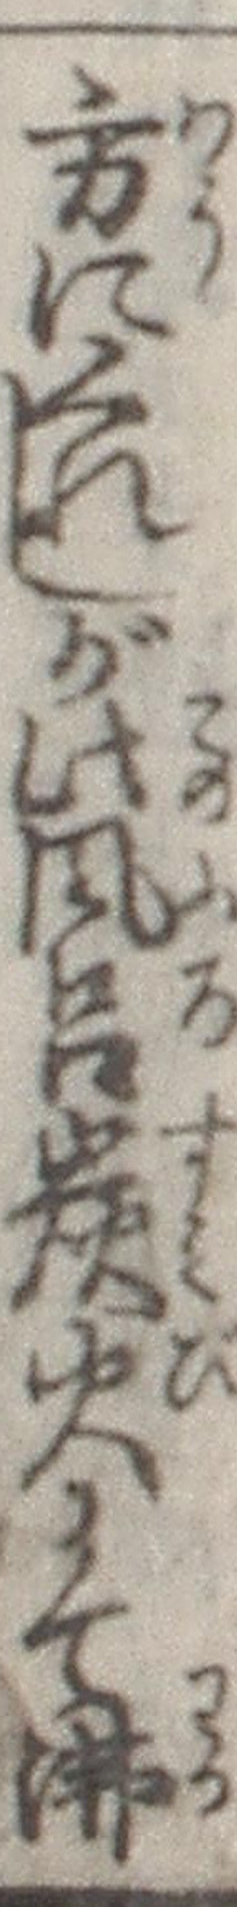方にくれしが此風呂炭火にて沸
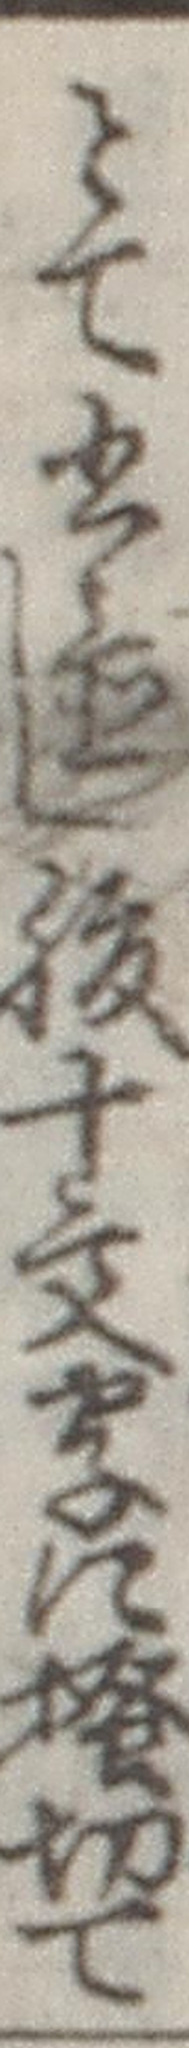とて書置し腹十文字に搔切て
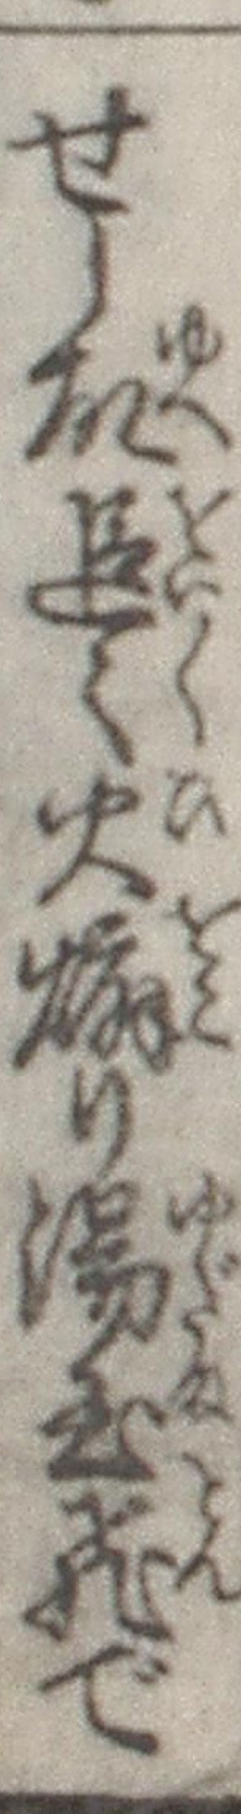せし故追〱火煽り湯玉飛で
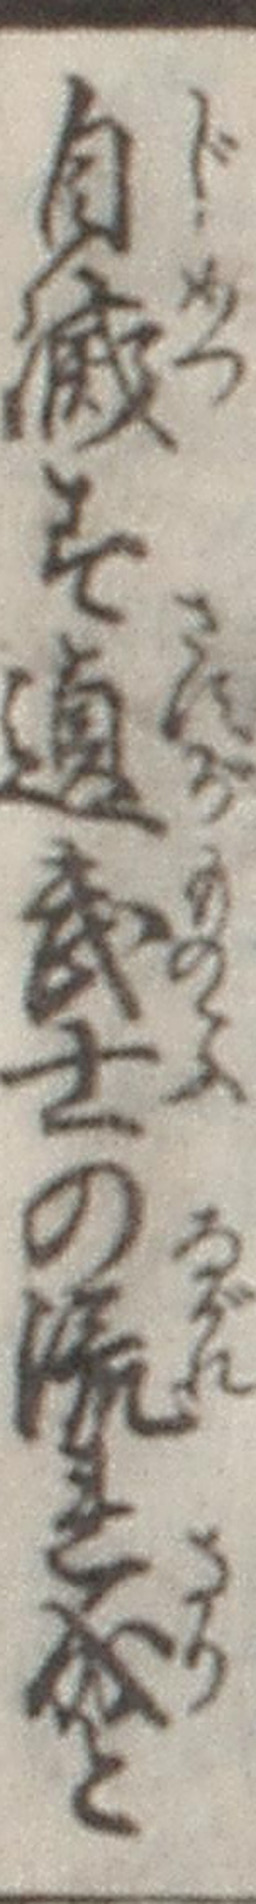自滅す遉武士の流れ成と
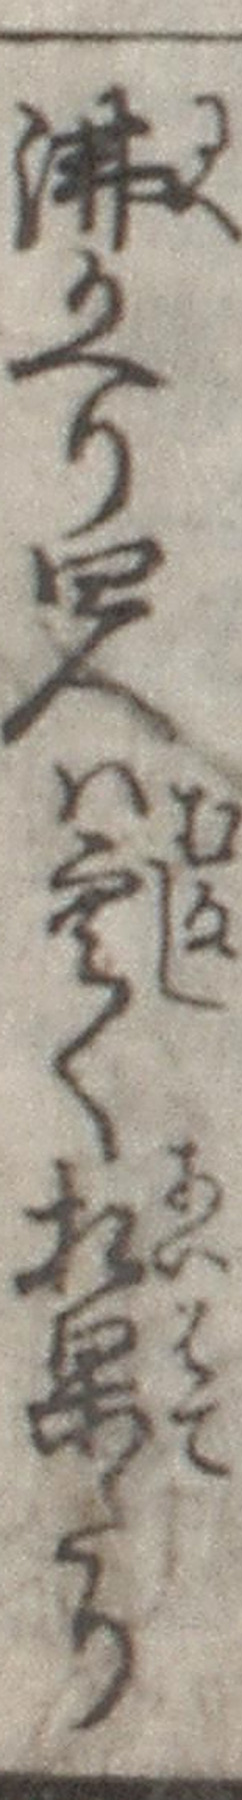沸かへり四人は空く相果たり

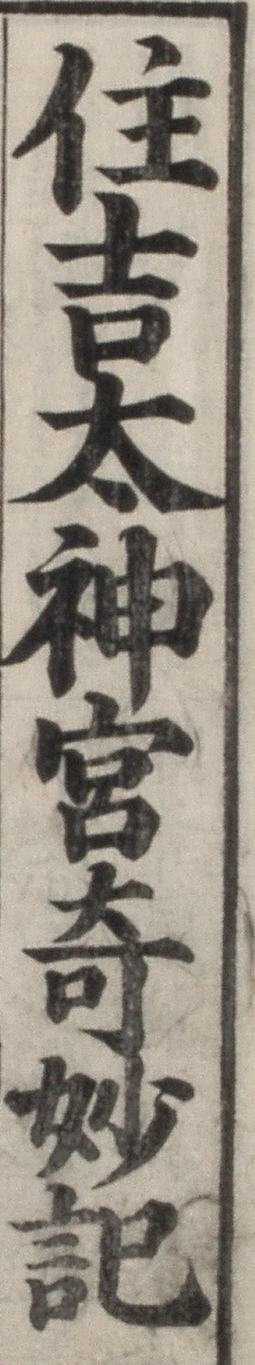住吉太神宮奇妙記
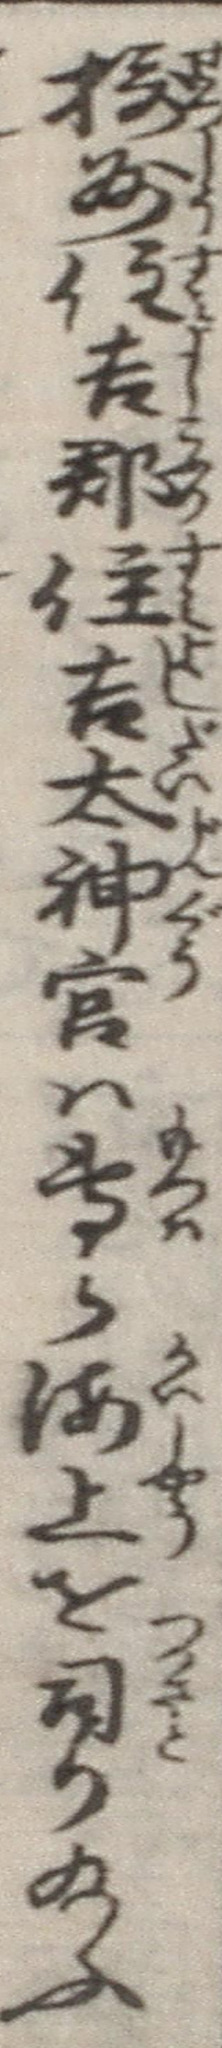摂州住吉郡住吉太神宮は専ら海上を司り給ふ
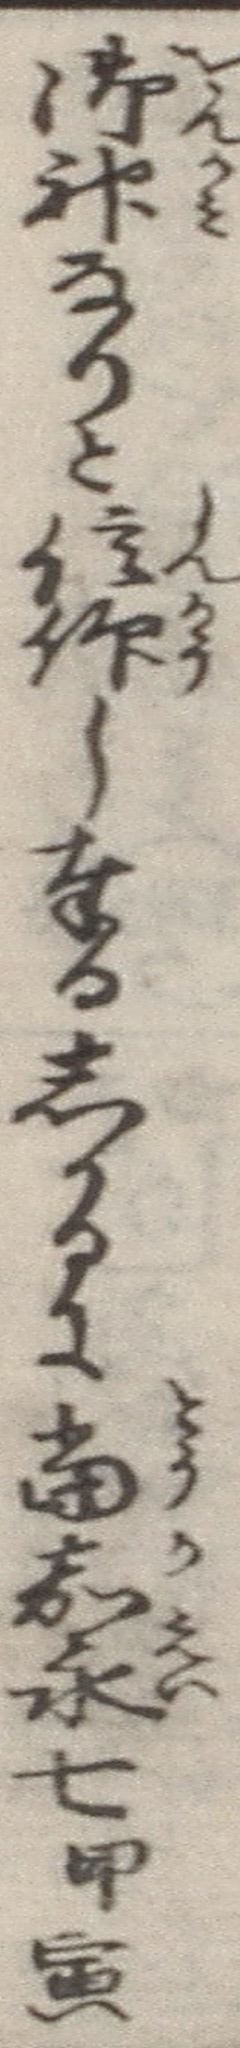御神なりと信仰し奉るしかるに当嘉永七甲寅
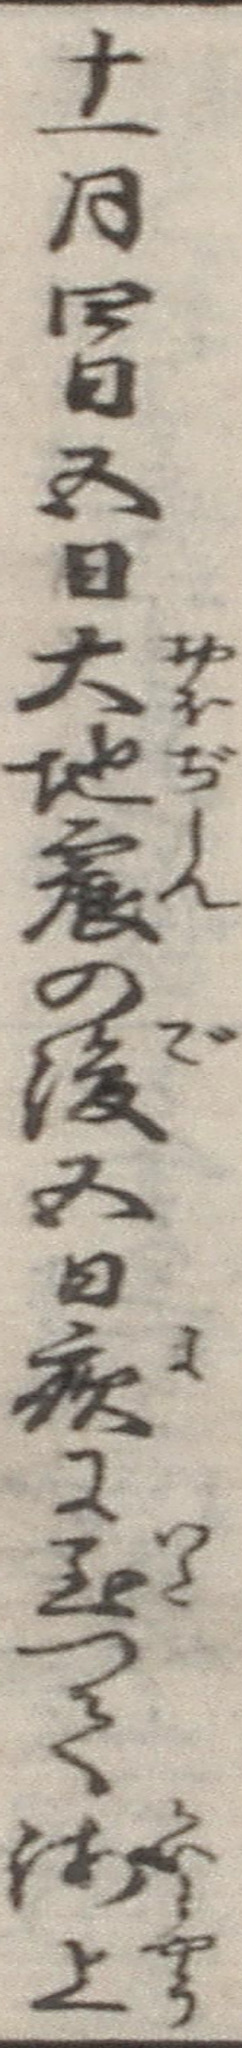十一月四日五日大地震の後五日夜に至って海上
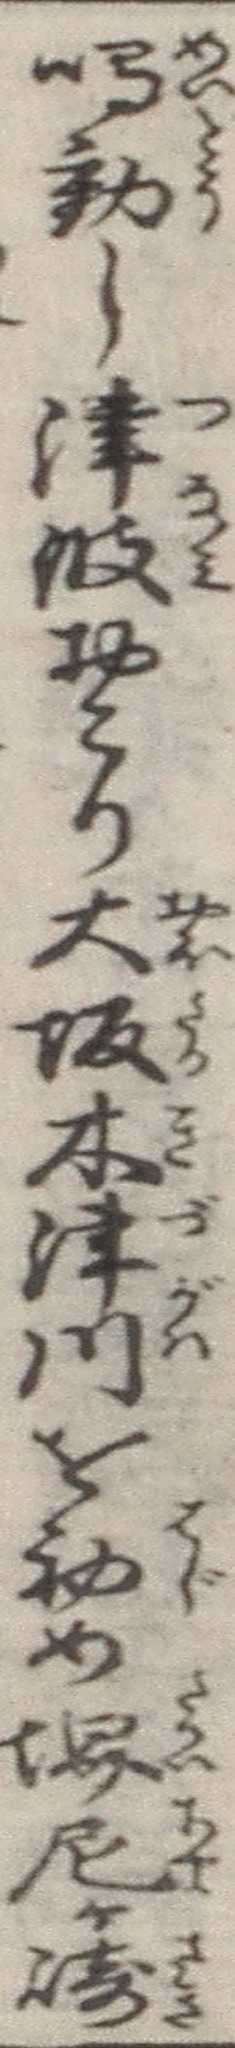鳴動し津波おこり大坂木津川を初め堺尼ケ崎
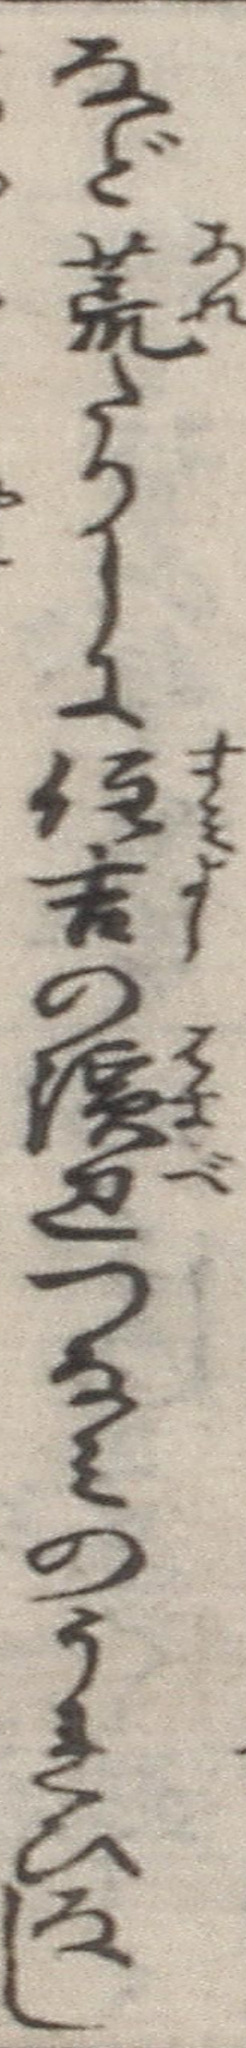など荒たりしに住吉の浜辺つなみのうれひなし
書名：諸國大地震年代記　末代噺種
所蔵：東京大学地震研究所図書室 Earthquake Research Institute Library, The University of Tokyo, JAPAN
